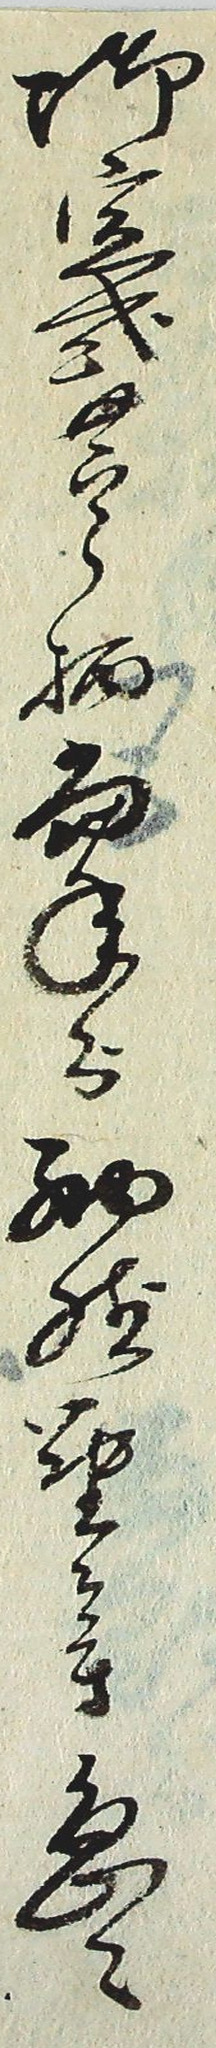御定式苧柄当年分納残御座候に付急々
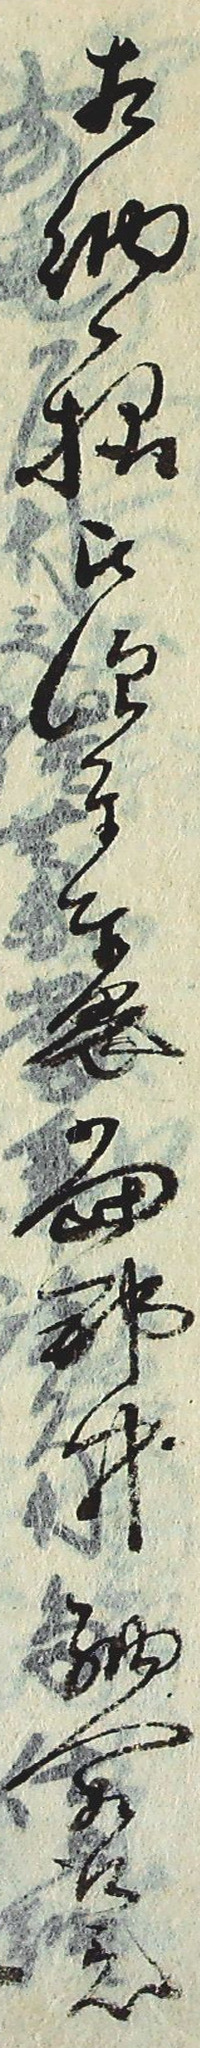相納候様被仰付奉畏当郡中納人相行着
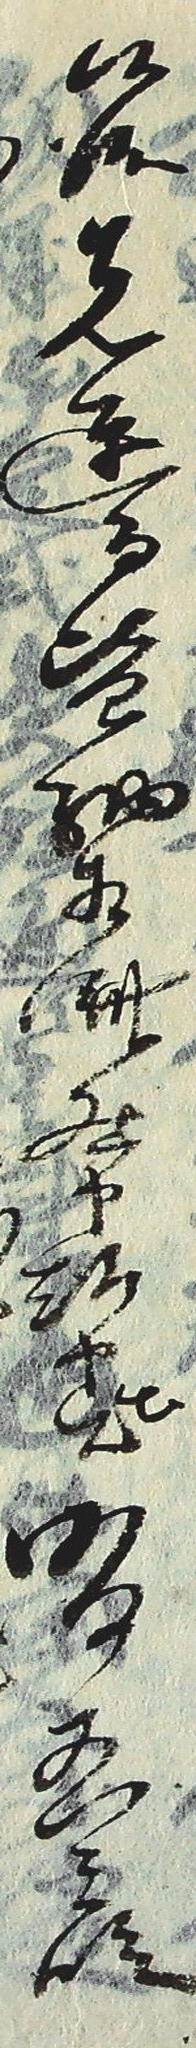候所先達て皆納相済居申趣申出候仍て右之段
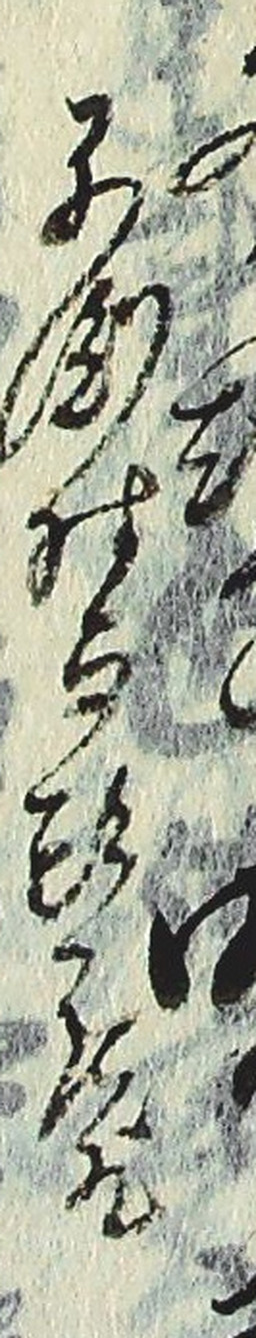早淵村与頭庄屋
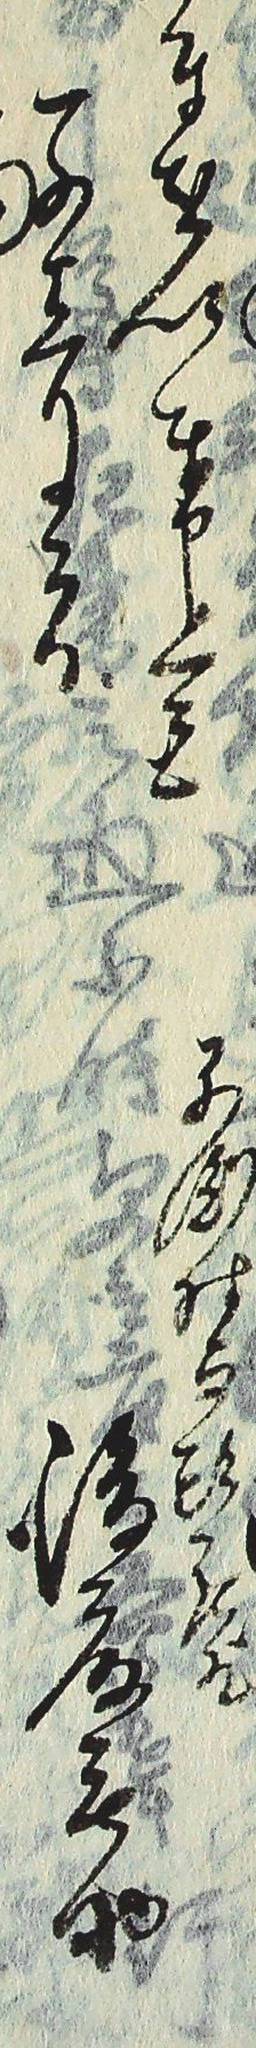子十二月二日後藤庄助
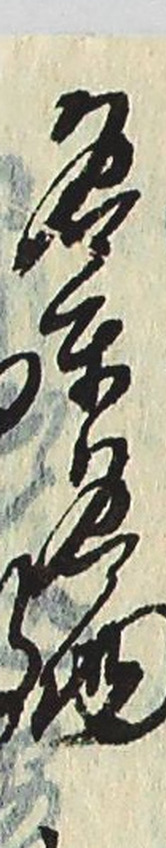名東名西
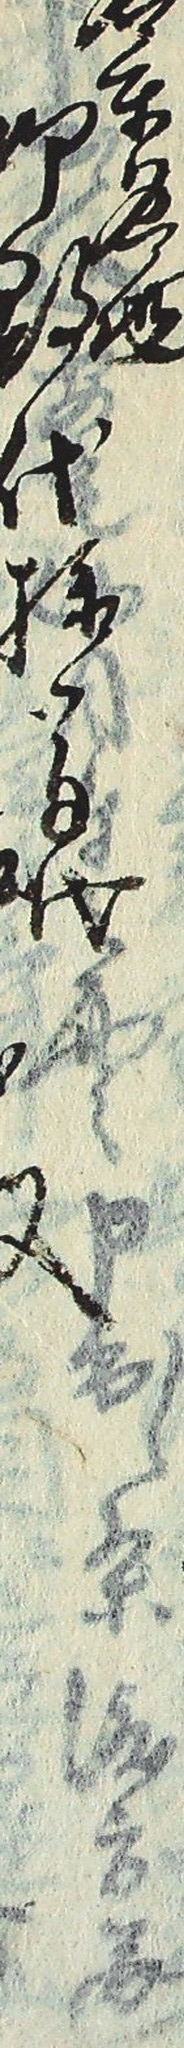御郡代様御手代
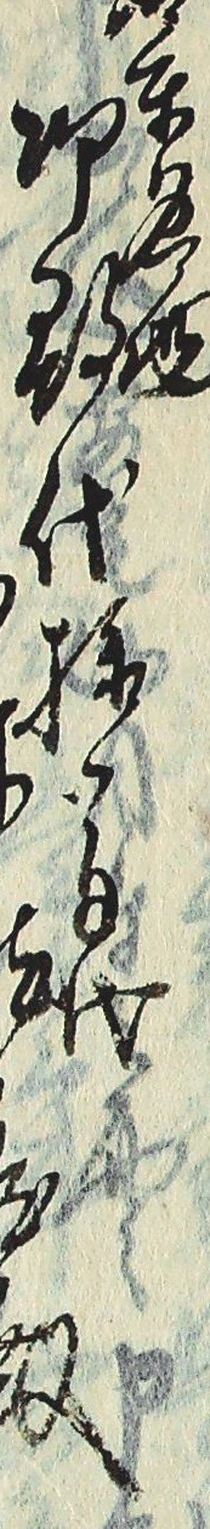御郡代様御手代
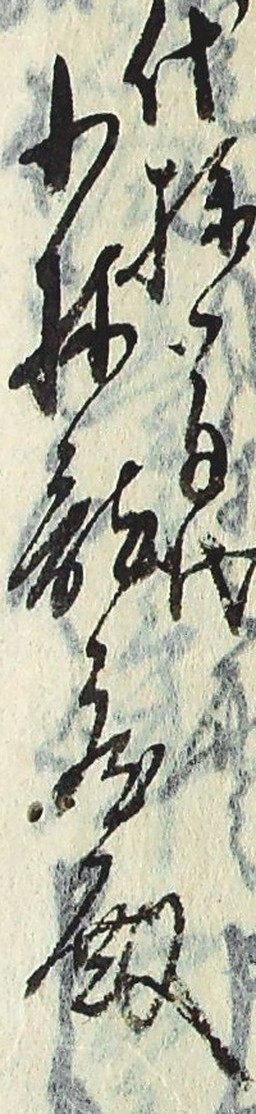小林龍蔵殿

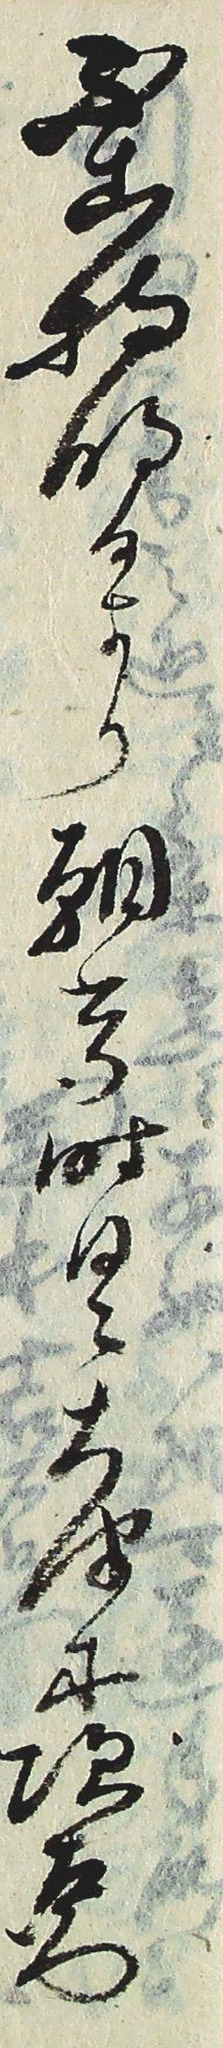乗持明日より朝六つ時日々大沢木次左衛門
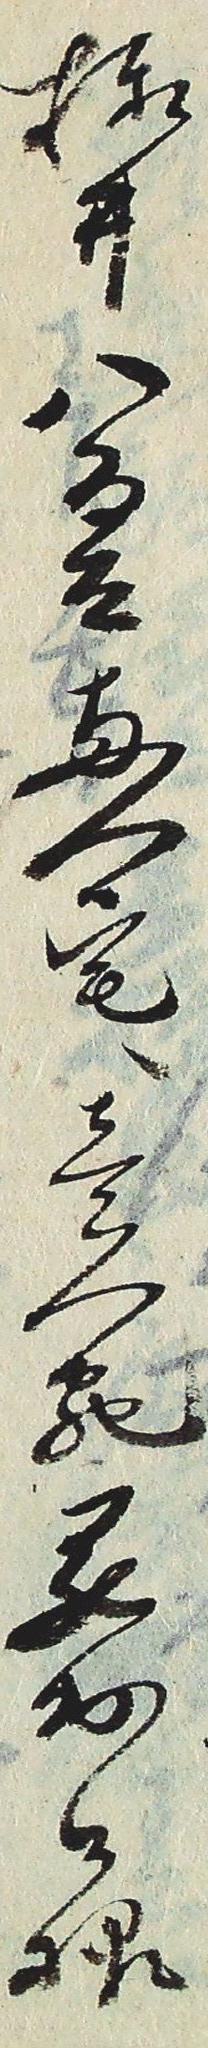桜井八百太両人宅へ壱人宛罷出候様
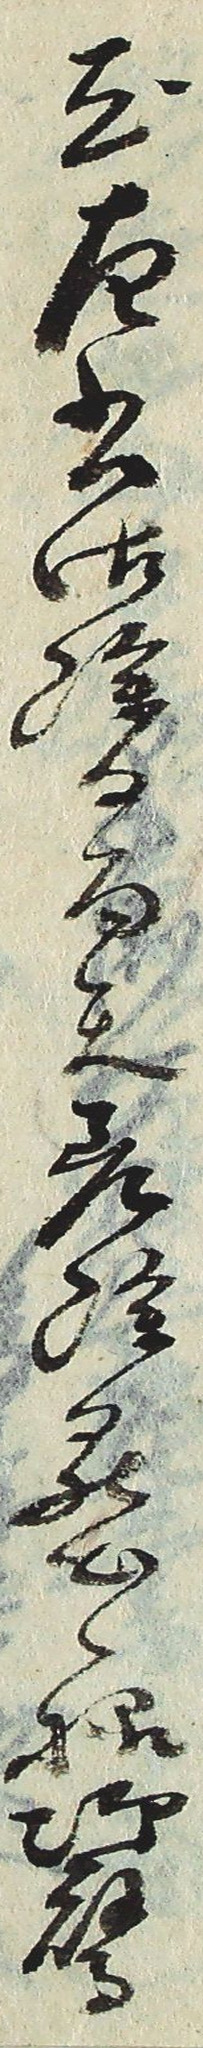尤左書御除日雨天差除罷出候様御鷹
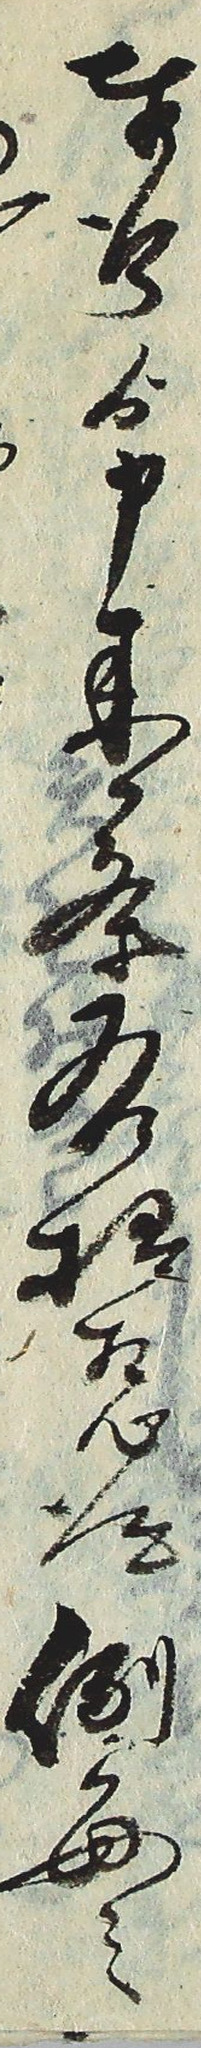奉行ゟ申来候条右様相心得例毎之
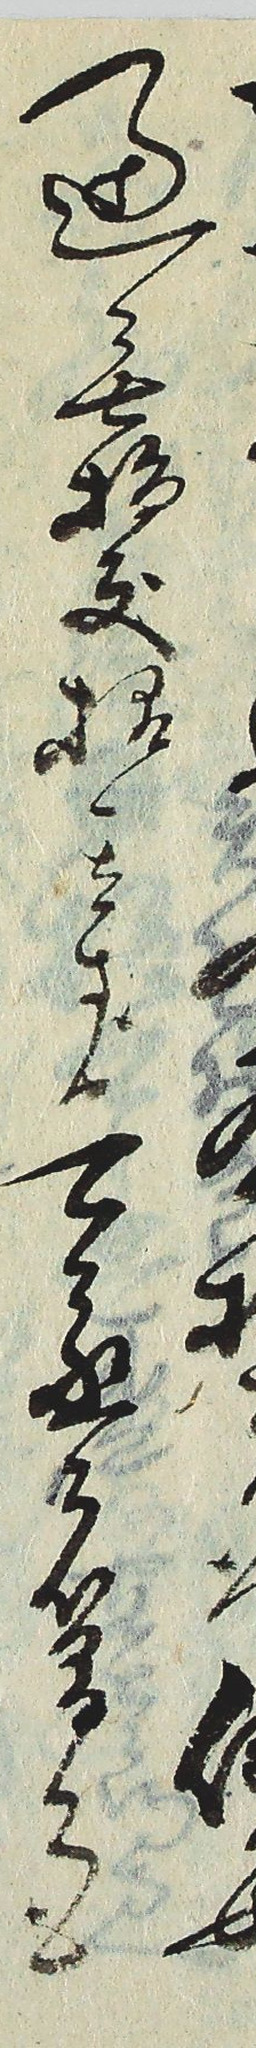通無指支様其方ゟ可遂了簡候以上
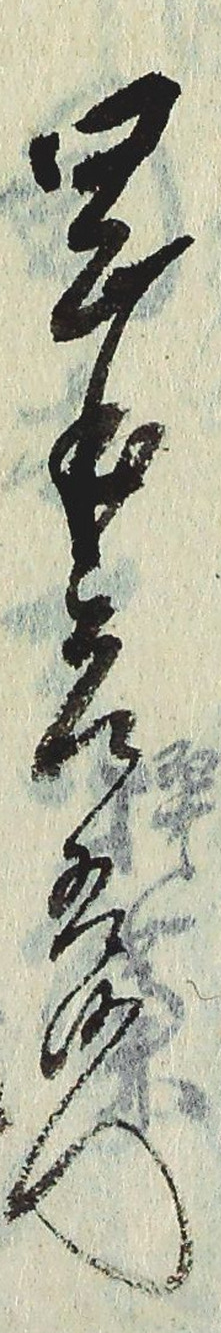岡本吉右衛門
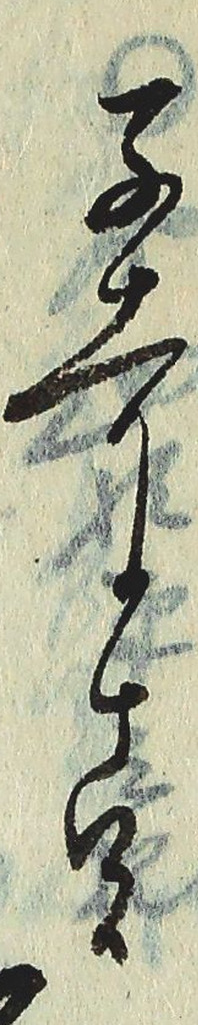子十一月十四日
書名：名東郡中諸割賦元帳
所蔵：鳴門教育大学 Naruto University of Education
